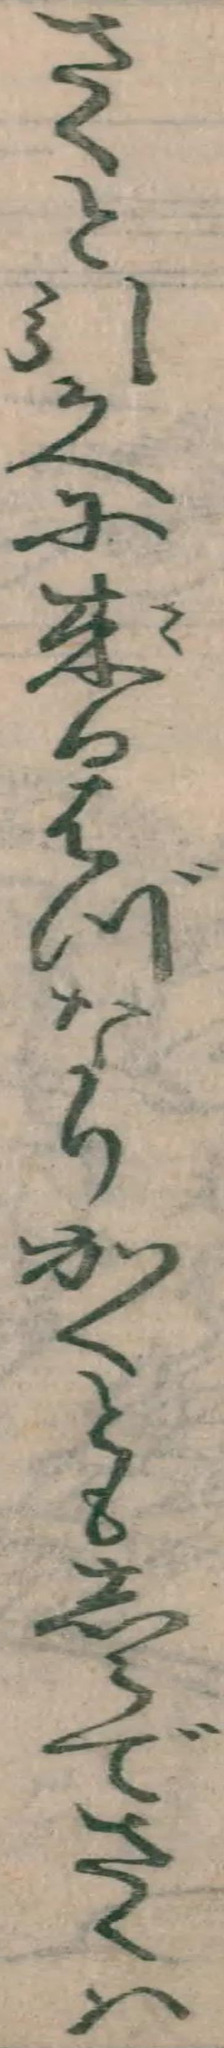さくと引かへに来るはづなりかくともしらでさくは
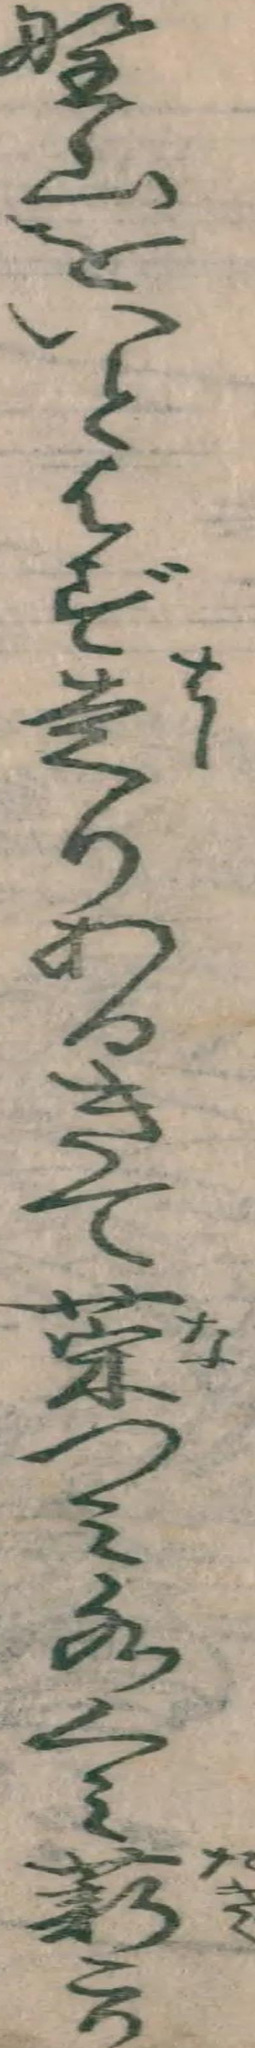野山をいとはず走りあるきて菜つみ水くみ薪こり
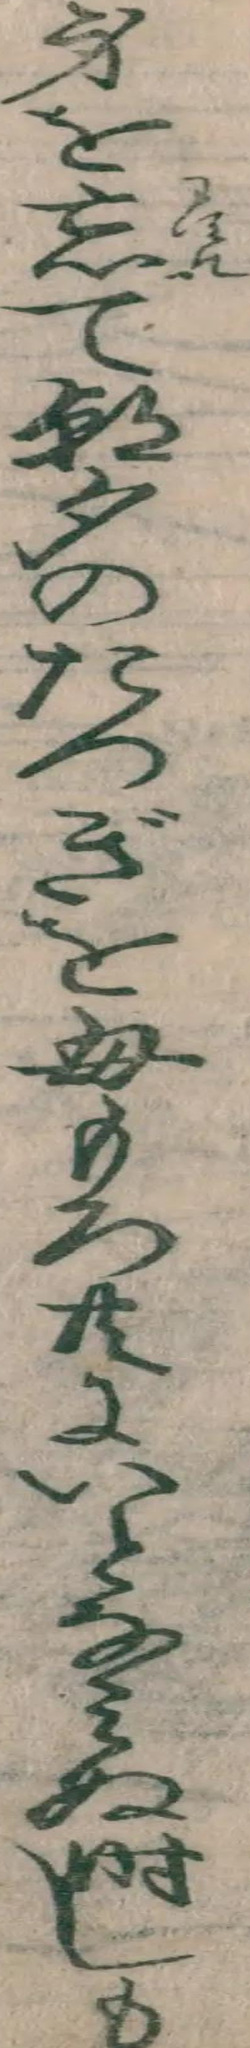身を忘て朝夕のたつぎを母もろ共にいとなみぬ時しも
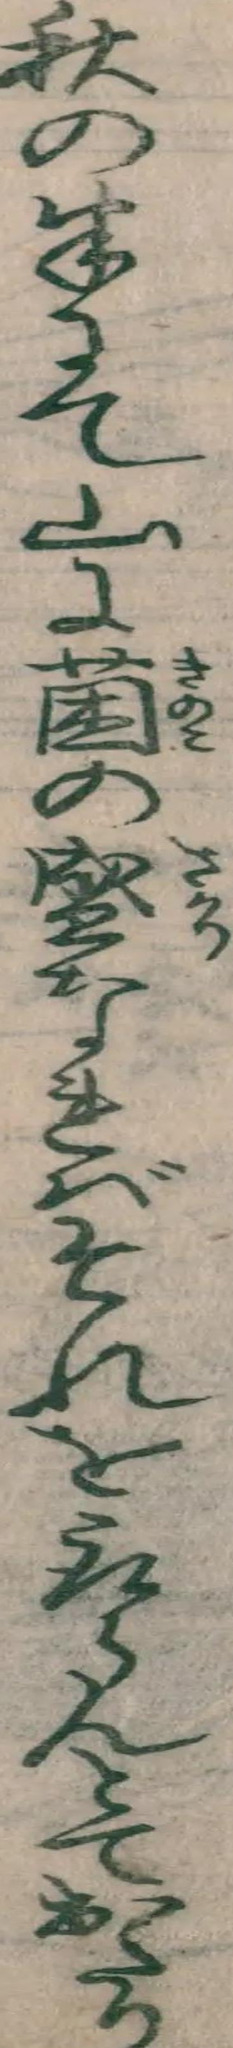秋の半にて山に菌の盛なればそれを取らんとて出たり
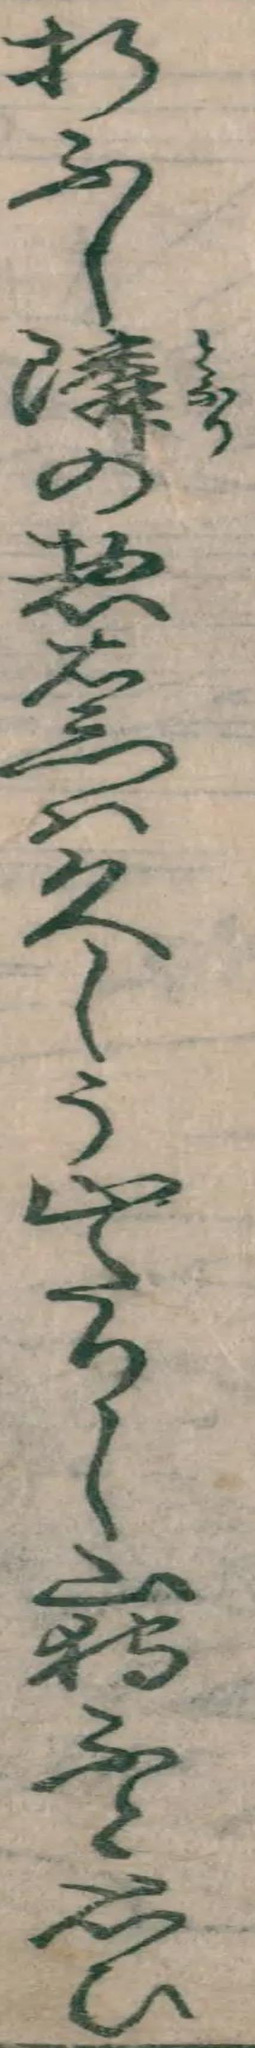折ふし隣の惣右衛門は久しう止たりし山狩ふと思ひ
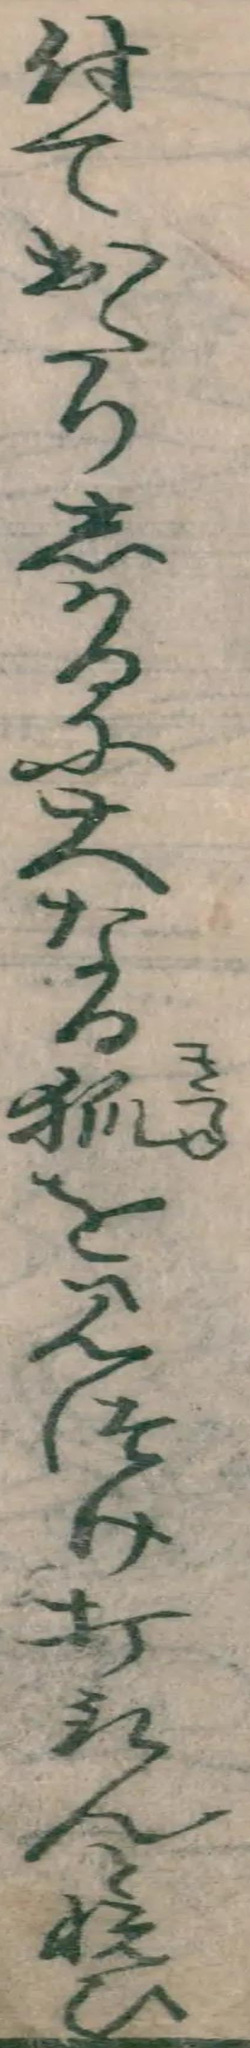付て出たりしかるに大なる狐を見つけ打取んと悦ひ
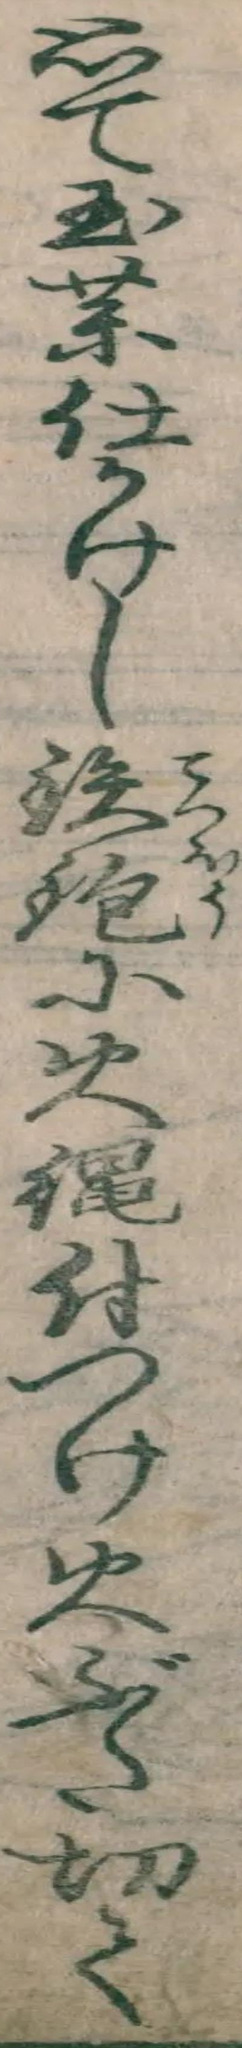思て玉薬仕かけし鉄砲に火縄付つけ火ぶた切て
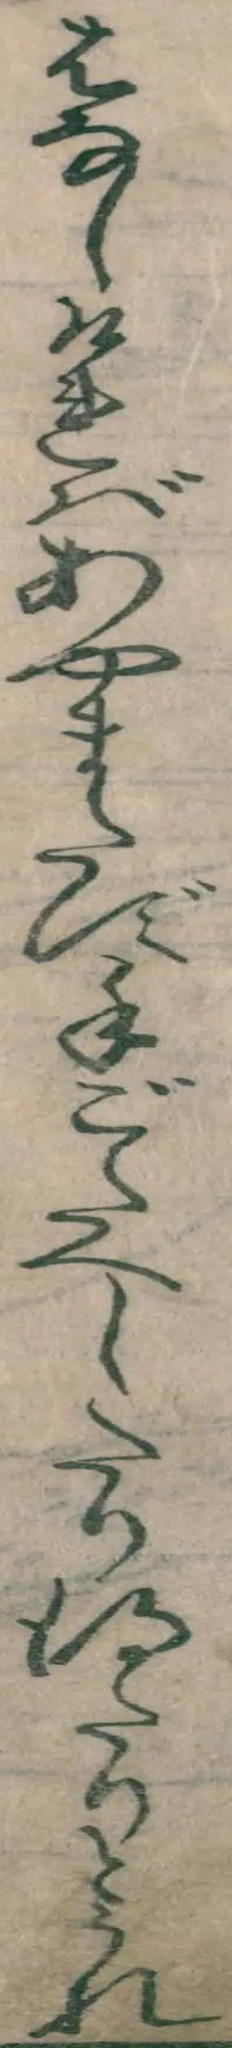はなしければあやまたず手ごたへしたり得たりとうれ
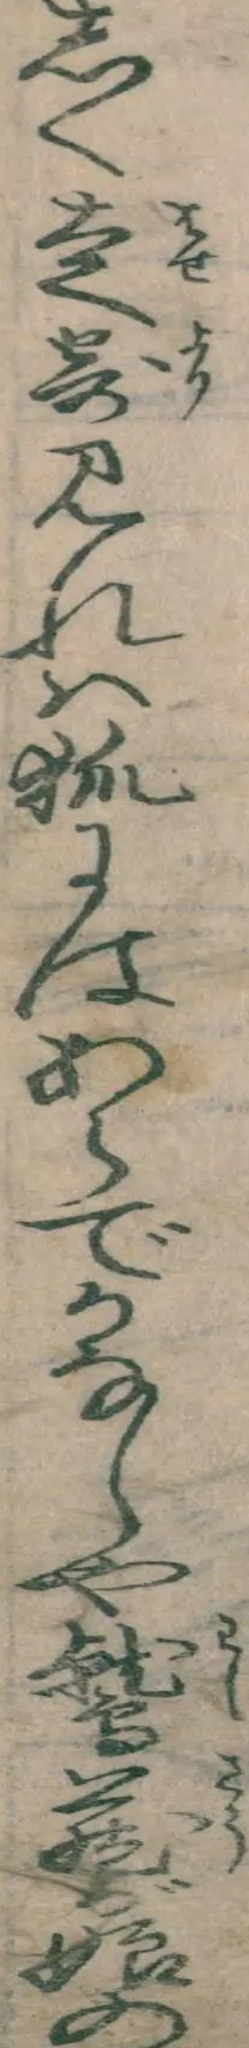しく走寄見れは狐にはあらでかなしや鷲蔵が娘の

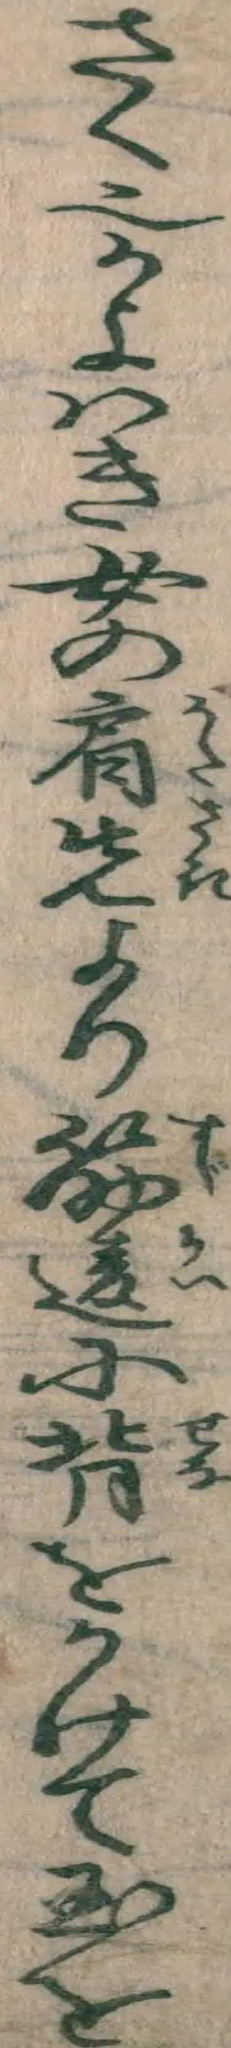さく也かよはき女の肩先より筋違に背をかけて玉を
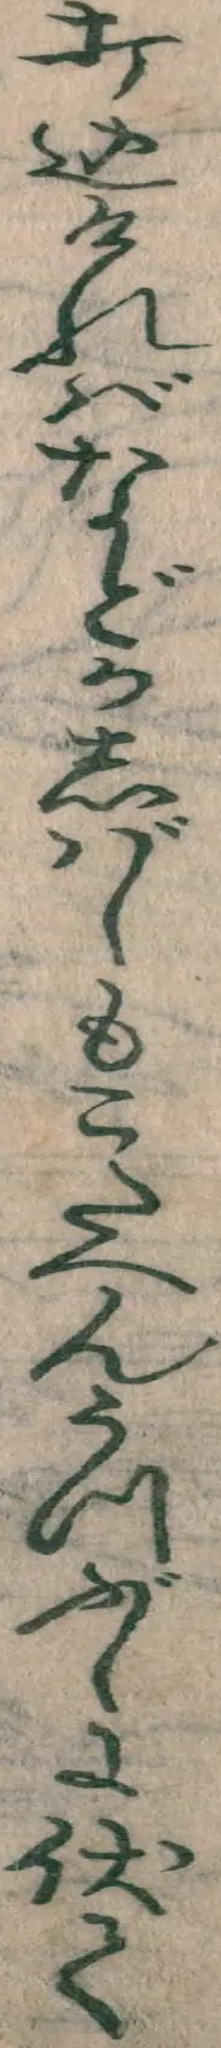打込ければなどかしばしもこたへんうつぶしに伏て
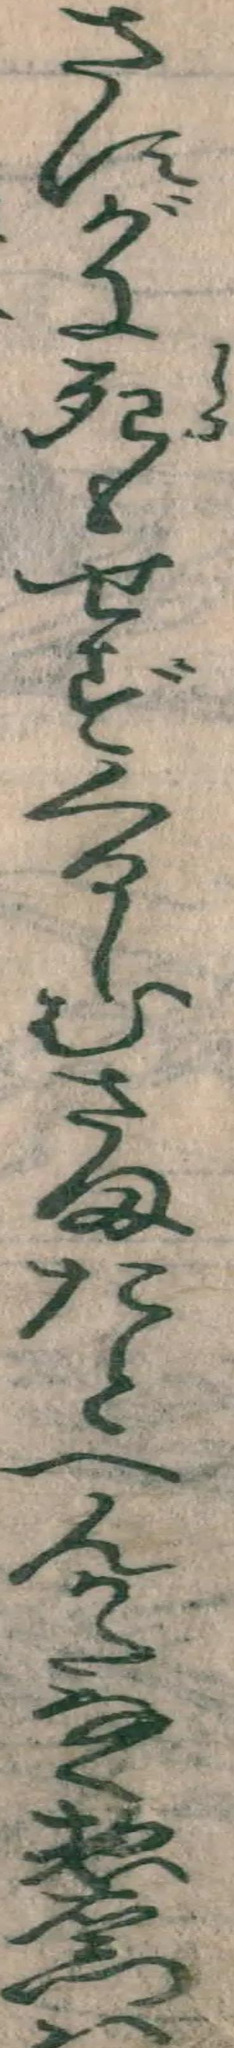さすがに死もせずくるしむさまたとへんかたなく惣右衛門は
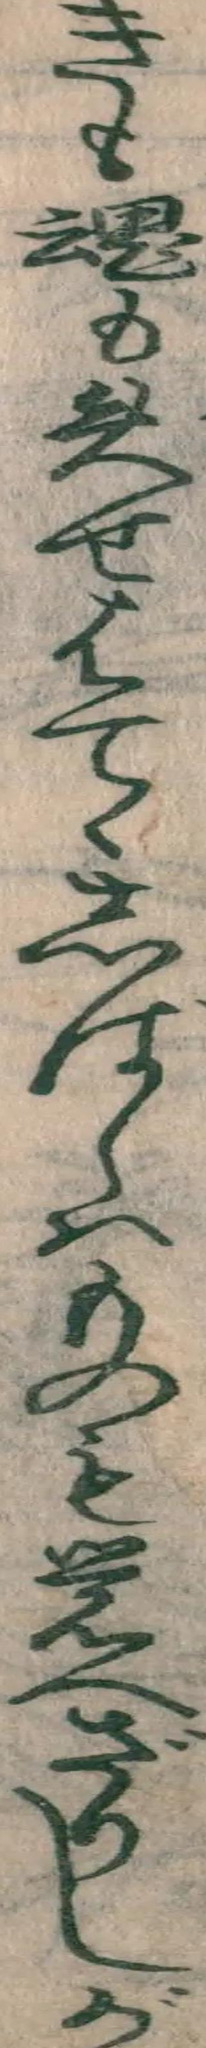きも魂も失せはてゝしばしはものも覚へざりしが
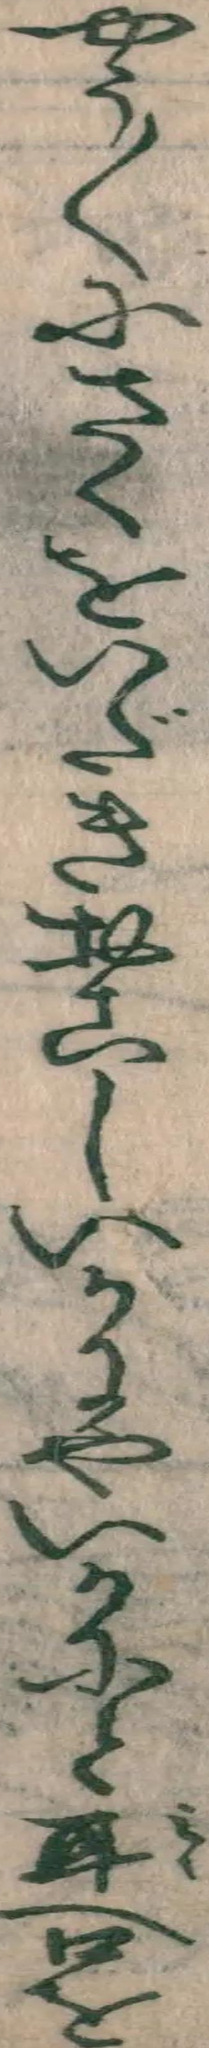やう〳〵にさくをいだきおこしいかにやいかにと耳へ口を
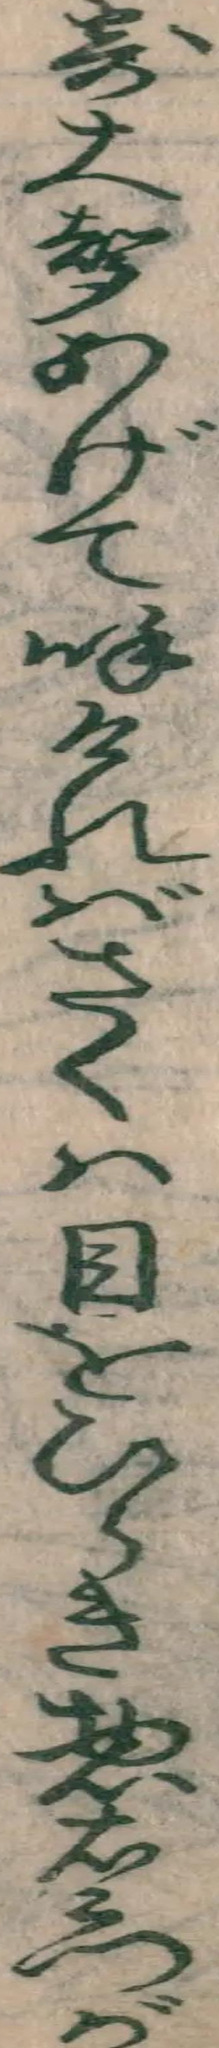寄大声あげて呼ければさくは目をひらき惣右衛門が
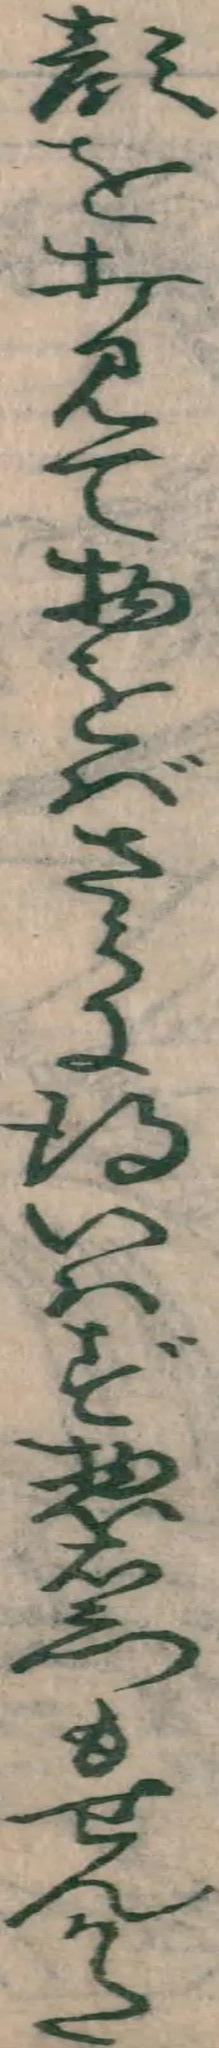顔を打見て物をばさらに得いはず惣右衛門もせんかた
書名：怪談御伽童 5巻. [1]
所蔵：国立国会図書館 National Diet Library, JAPAN
